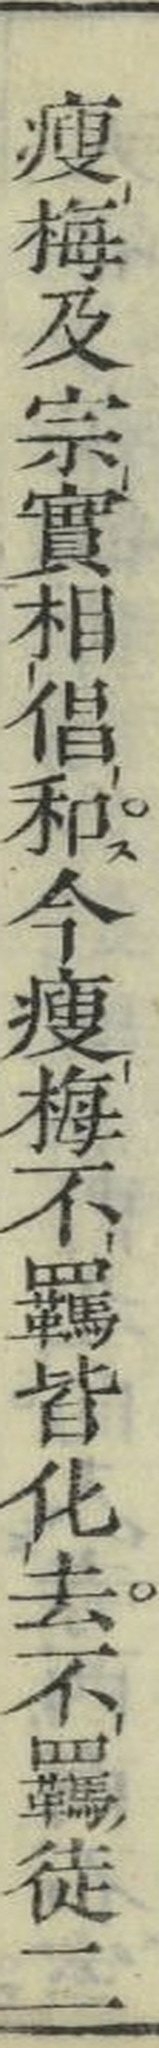痩-梅及宗-実相-倡-和。今痩-梅不-羈皆化-去。不-羈徒二
